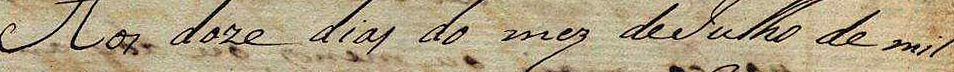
Aos doze dias do mez de Julho de mil
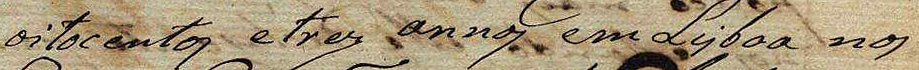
oitocentos e trez annos em Lisboas nos
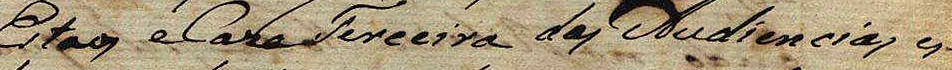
Estaos e Caza Terceira das Audiencias es
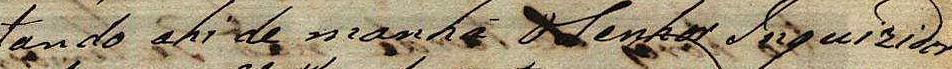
tando ahi de manhã o Senhor Inquizidor
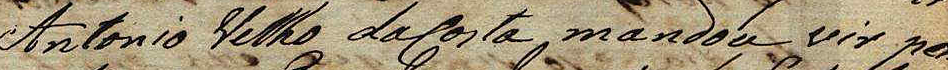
Antonio Velho da Costa mandou vir per
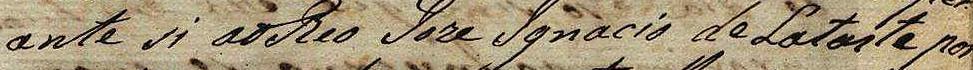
ante si ao Reo Joze Ignacio de Lataste por
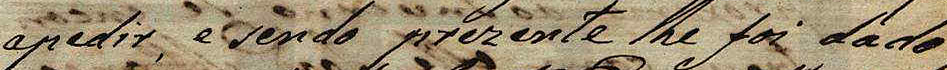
apedir, e sendo prezente lhe foi dado
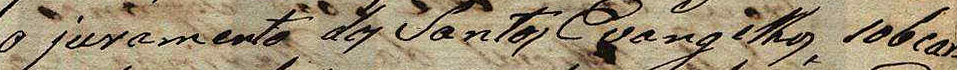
o juramento dos Santos Evangelhos, sob car
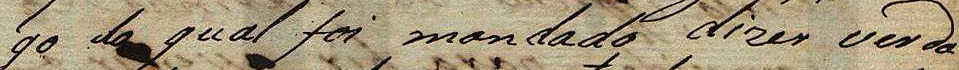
go do qual foi mandado dizer verda
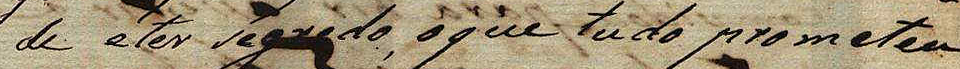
de e ter segredo, o que tudo prometeu
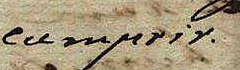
cumprir.
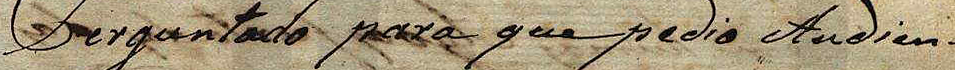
Perguntado para que pedio Audien
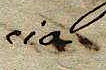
cia
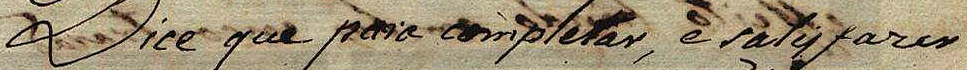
Dice que pera completar, e satisfazer
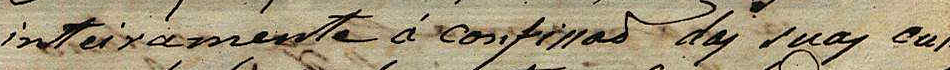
inteiramente á confissaõ das suas cul
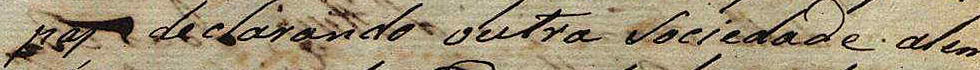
pas, declarando outra sociedade alem
